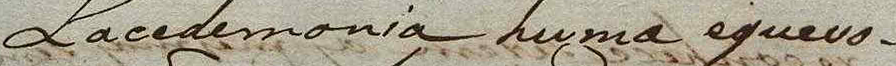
Lacedemonia huma equevo
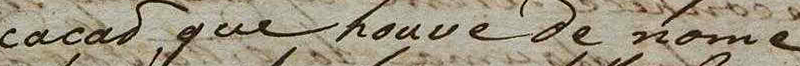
caçaõ, que houve de nome
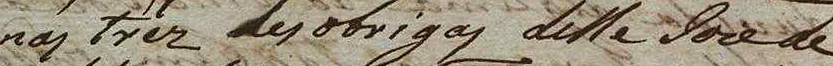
nas trez desobrigas delle Ioze de
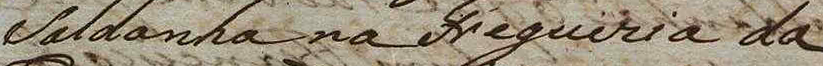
Saldanha na Freguizia da
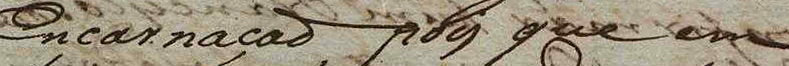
Encarnação pois que em
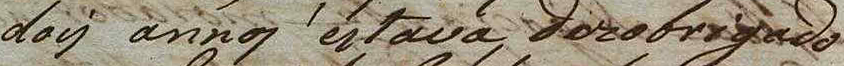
dois annos estava dezobrigado
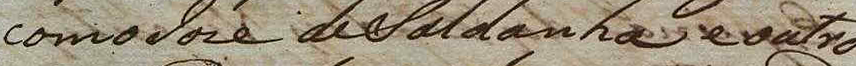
como Ioze de Saldanha e outro
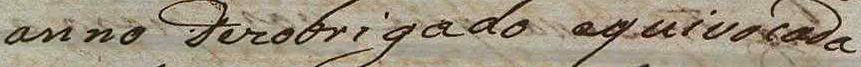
anno Dezobrigado equivocada
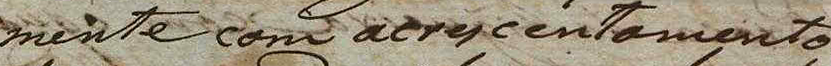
mente com acrescentamento
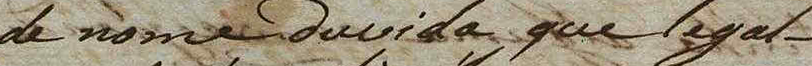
de nome, duvida, que legal
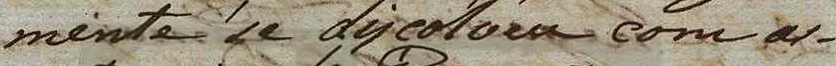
mente se disçolveu com as
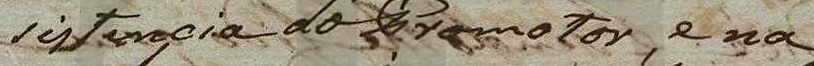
sistencia do Promotor, e na
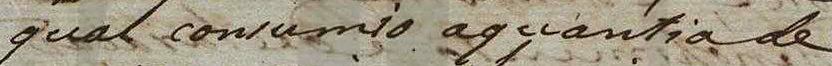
qual consumio a quantia de
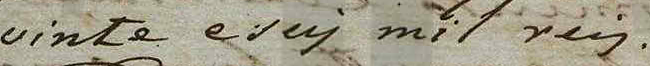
vinte e seis mil reis.
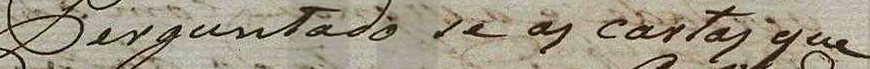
Perguntado se as cartas que
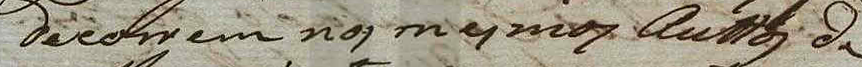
decorrem nos mesmos Auttos da
